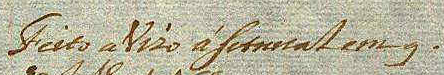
Feito aVizo á setuual em 9.
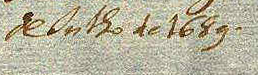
de Iulho de 1689.
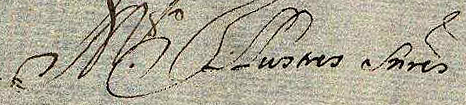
M.to Jllustres Snres̄
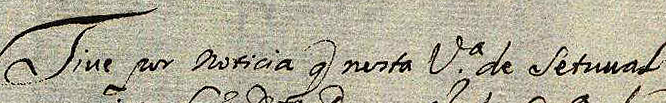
Tiue por noticia q̄ nesta V.a de Setuual
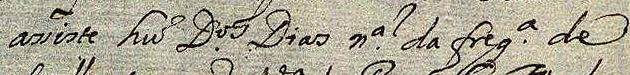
assiste hū D.os Dias n.al da freg.a de
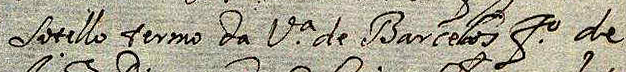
Sotello termo da V.a de Barcelos f.o de
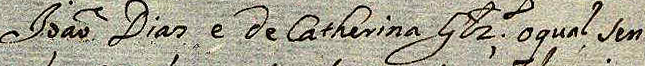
Ioaõ Dias e de Catherina Glz̄; o qual sen
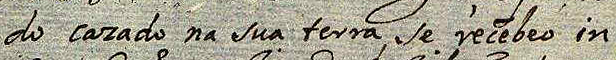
do cazado na sua terra, se recebeo in
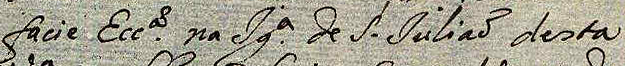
facie Ecc.æ na Ig.a de S. Iuliaõ desta
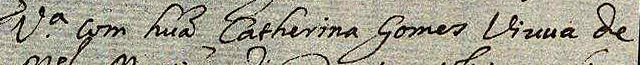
V.a com huā Catherina Gomes Viuua de
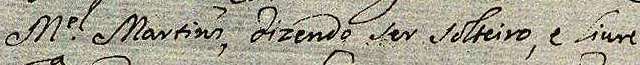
Me.l Martins, dizendo ser solteiro, e liure
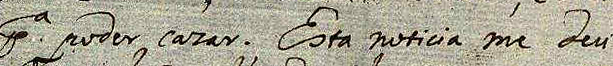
p.a poder cazar. Esta noticia me deu
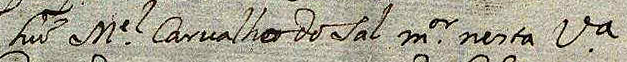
hū M.el Carualho do Sal mo.r nesta V.a
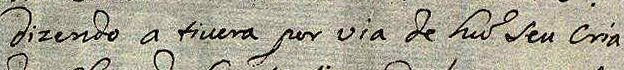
dizendo a tiuera por via de hū seu cria
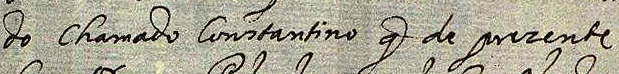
do chamado Constantino q̄ de prezente
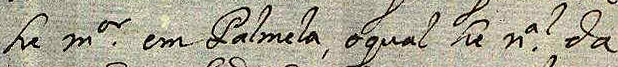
he mor. em Palmela, o qual he n.al da
